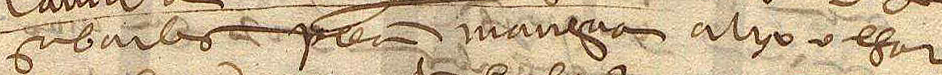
sabados pllā manhaa a vyo olhar
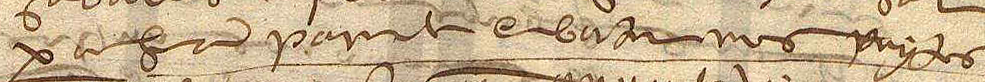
ꝑa huā parede e bater nos peytos
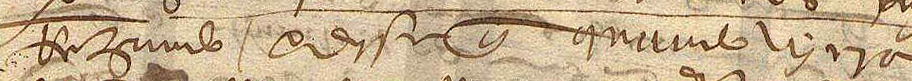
Rezando / e dyse q̄ quando vyera
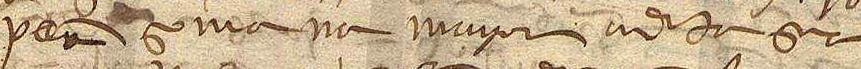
pllā somana mayor a dita sua
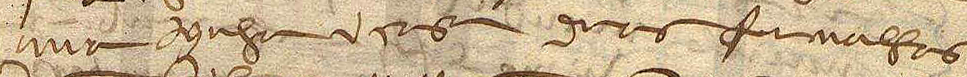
ama tynha ē casa duas fornalhas
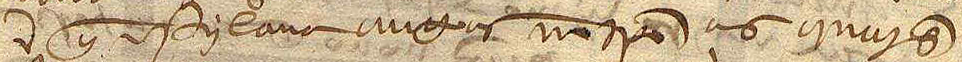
ē q̄ estylaua augoas n̄o tpō as quajs
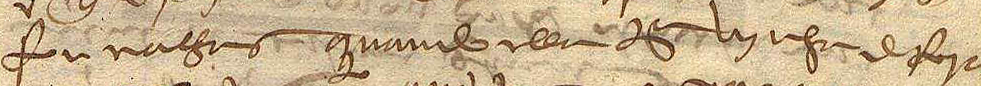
fornalhas quando ella ta vynha de fora
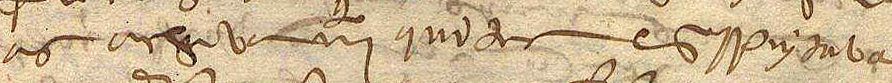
as achava mto quētes e sospeytava
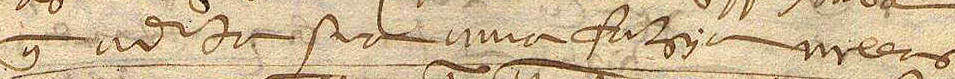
q̄ a dita sua ama fazya nellas
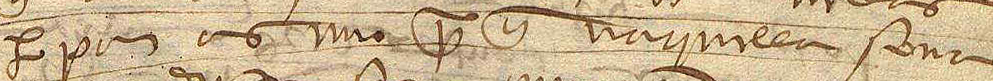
ho pam asmo p̄oq̄ naquella soma
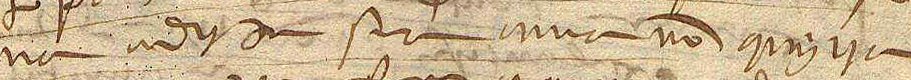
na a dyta sua ama n̄o quyrja
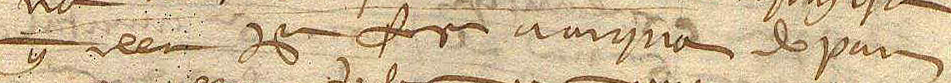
q̄ ella ta fose a arqua do pam
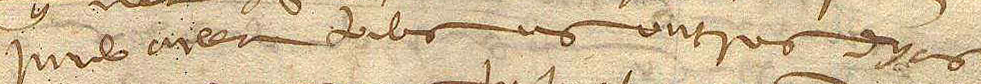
Jmdo a ella todos os outros dyas
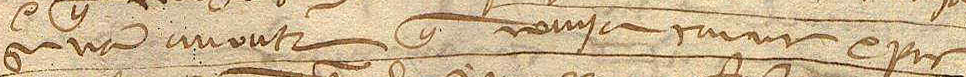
senā a noute q̄ comja carne e pes
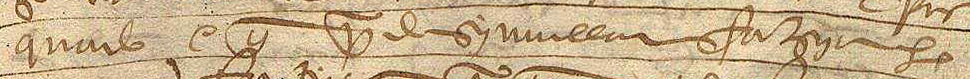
quado q̄ p̄o desymullar fazya ho
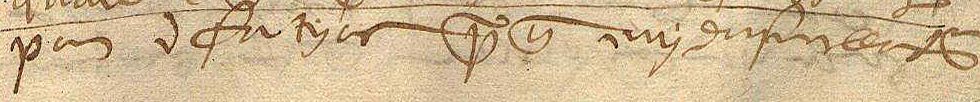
pam ē fatyas p̄o q̄ cuydase ella ta
